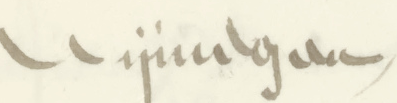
Nijmegen.
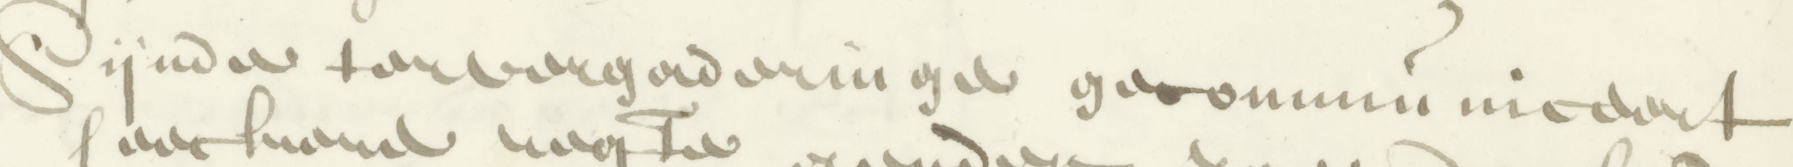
Sijnde ter vergaderinge gecommuniceert
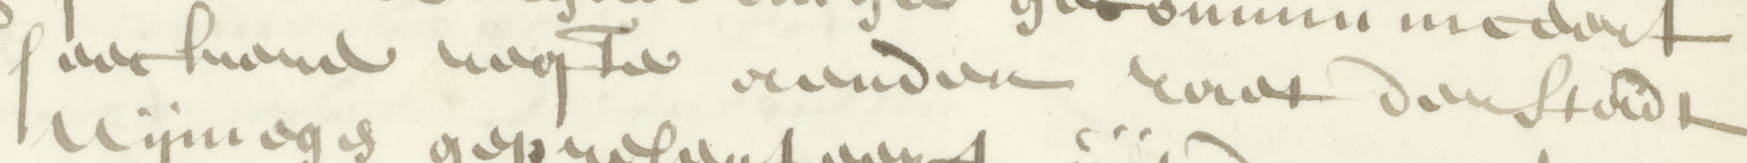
seeckere reqte aenden raet der stadt
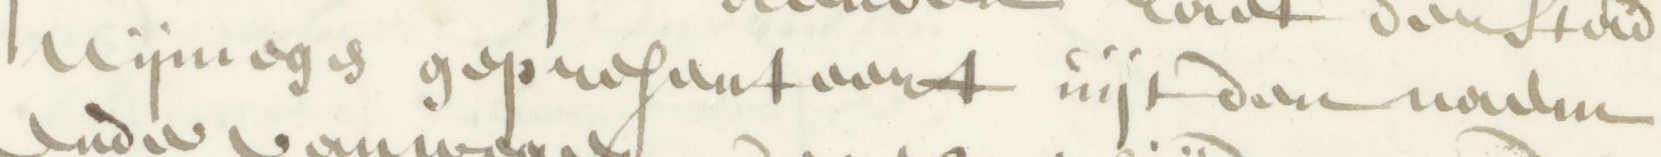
Nijmegen gepresenteert uijt den naem,
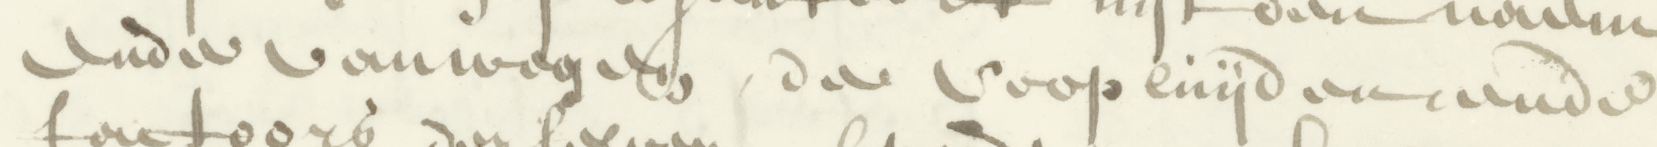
ende vanwegen, de Coopluijden, ende
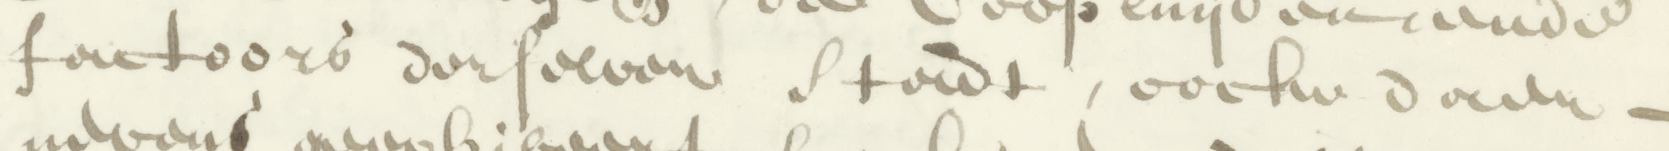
factoors derselver Stadt, oocke daer
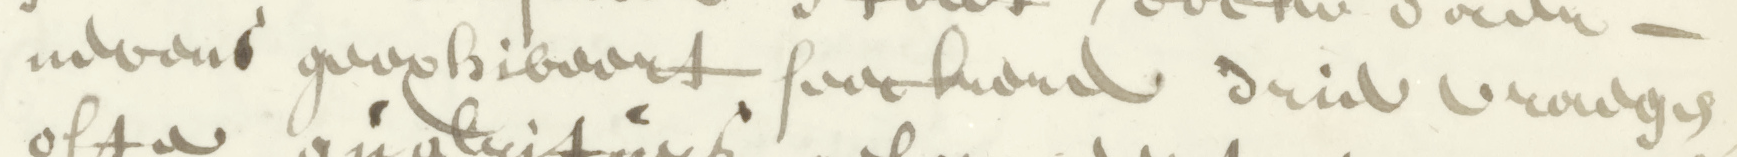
nevens geexhibeert seeckere drie vraegen
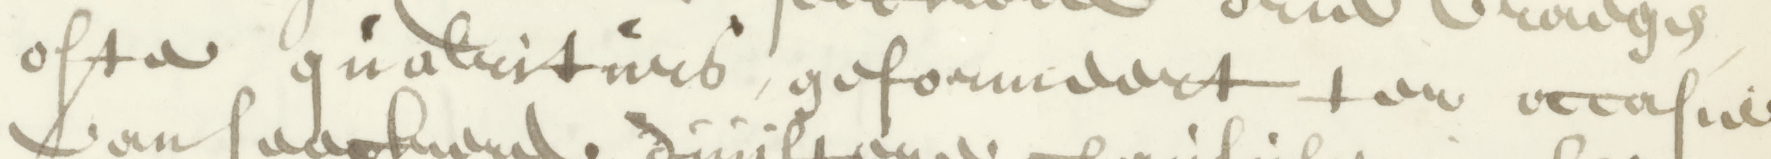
ofte quaeriturs, geformeert ter occasie
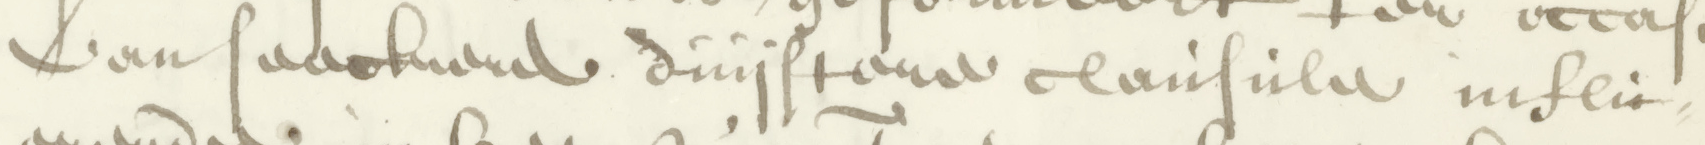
van seeckere duijstere clausule influ„,
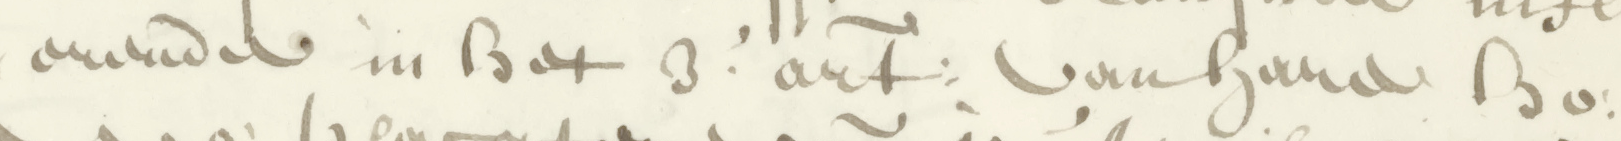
„erende in het 3e. art: van hare Ho:
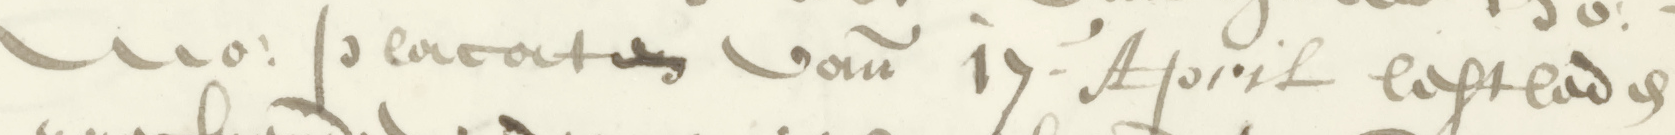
Mo: Placaten van 17e. April lestleden,
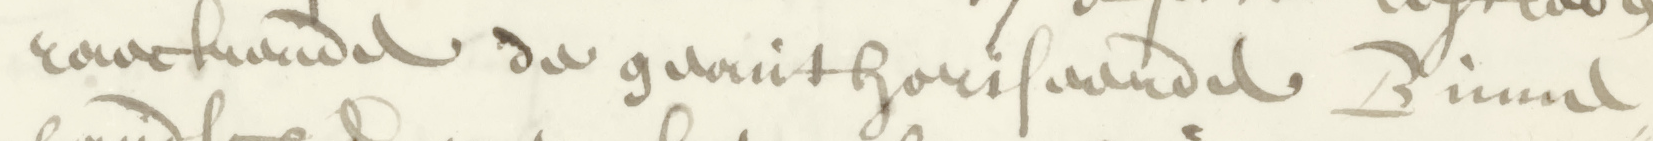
raeckende de geauthoriseerde Binne„
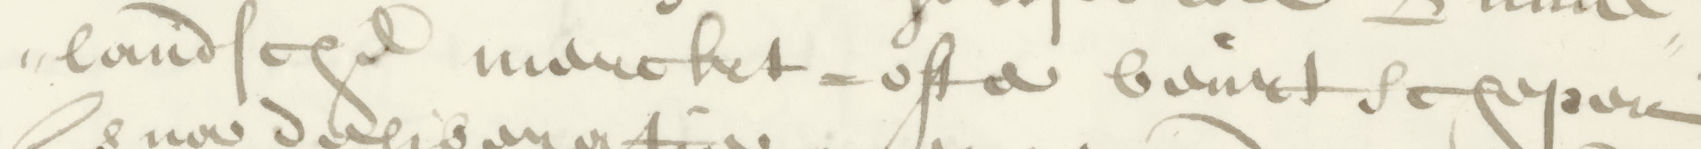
„landsche merckt - ofte beurt schepen.
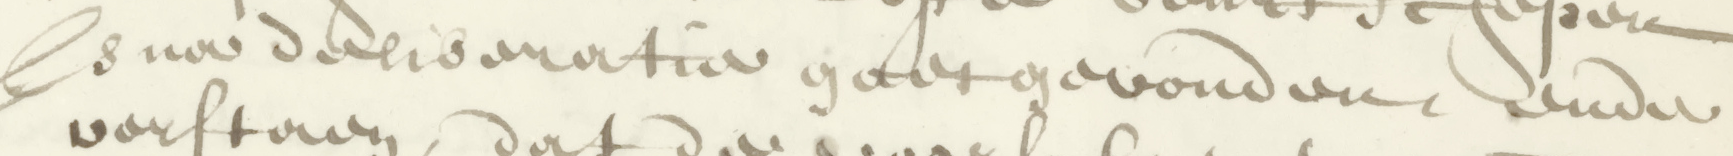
Is na deliberatie goet gevonden, ende
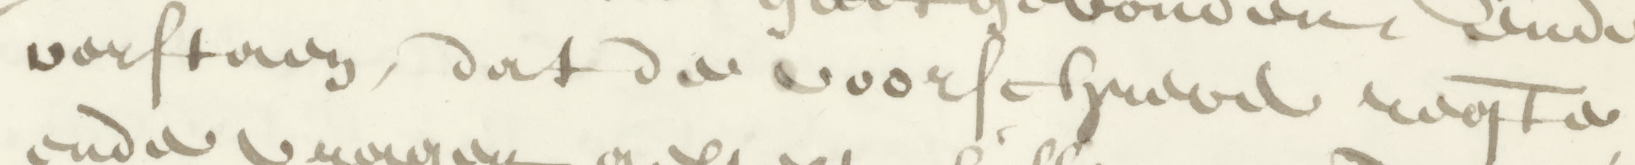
verstaen, dat de voorschreve reqte
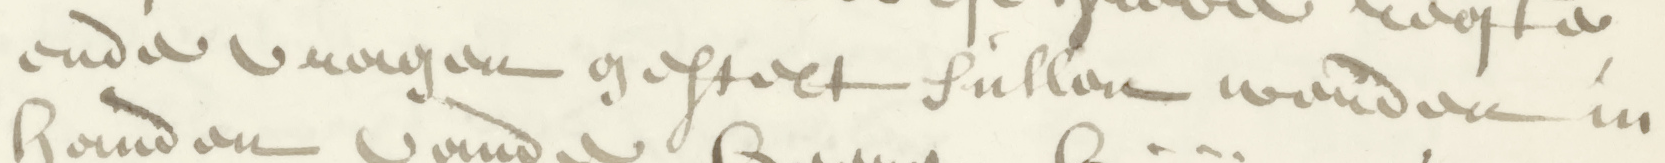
ende vragen gestelt sullen werden in
